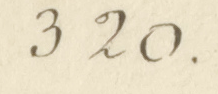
320.
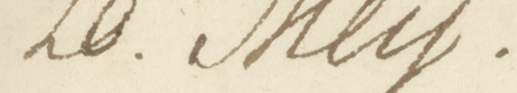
20. Meij.
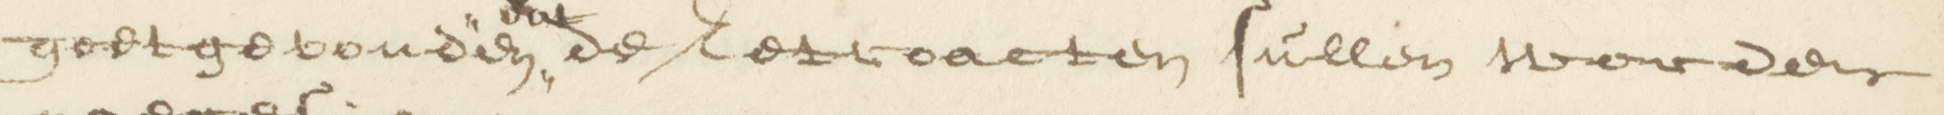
goetgevonden ,,dat ,, de retroacten sullen worden
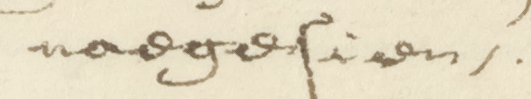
naegesien.
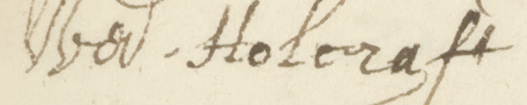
Wede, Holcraft
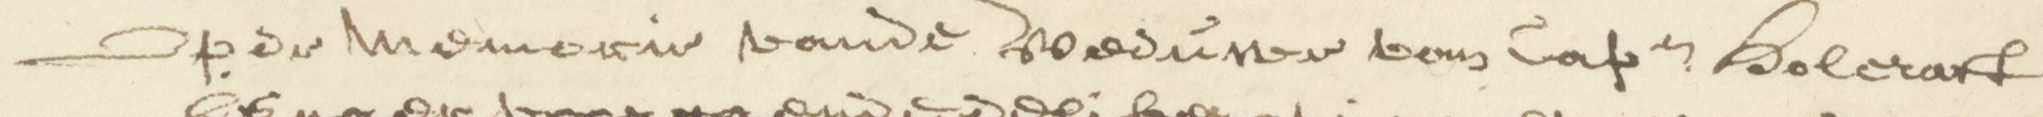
Opde memorie vande weduwe van Capn. Holcraft
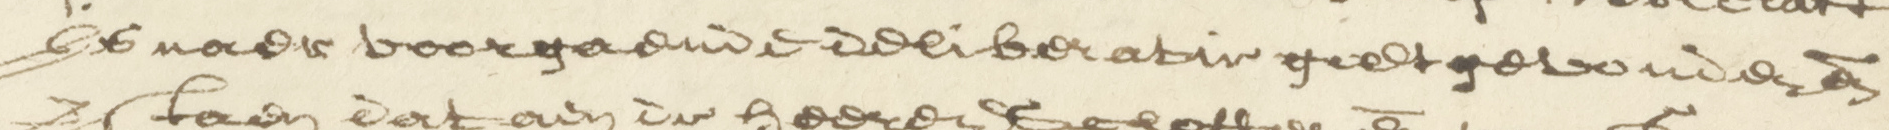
Is naer voorgaende deliberatie goetgevonden en
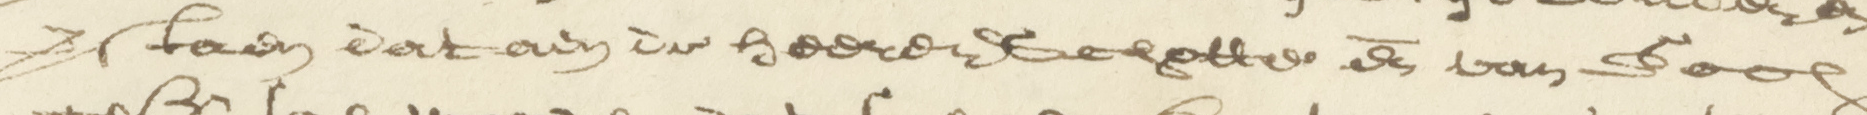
vstaen dat aen de heeren Schotte en van Goch
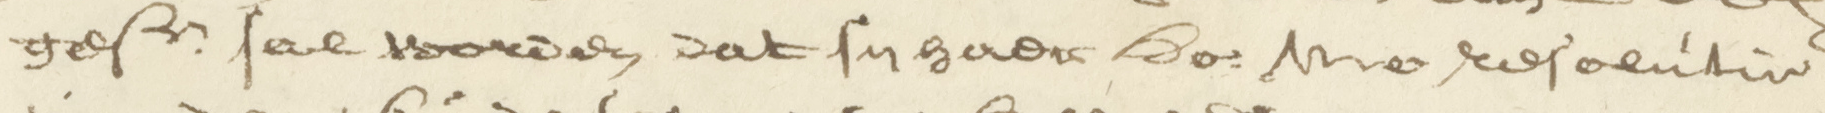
gesr. sal worden dat sy haer Ho:Mo resolutie
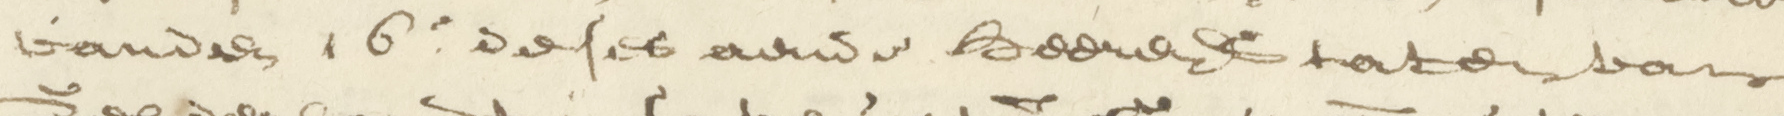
vanden 16e. deses aende Heeren Staten van
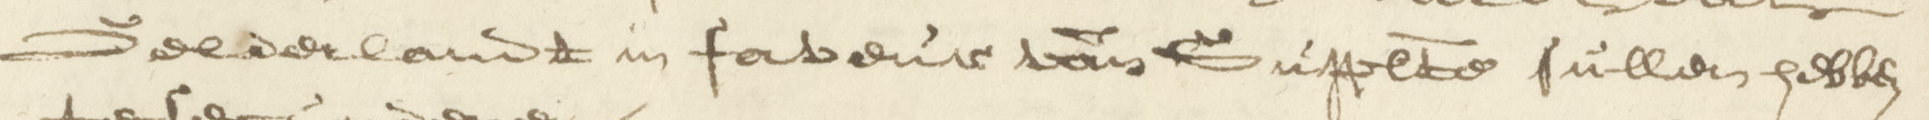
Gelderlandt in faveur van Supplte sullen hebben
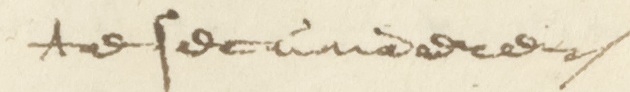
te secunderen.
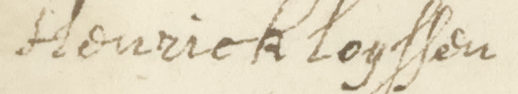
Henrick Loyssen
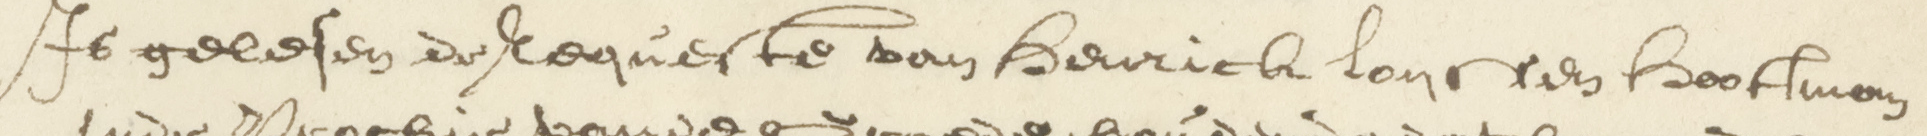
Is gelesen de requeste van Henrick Loyssen Hooftman
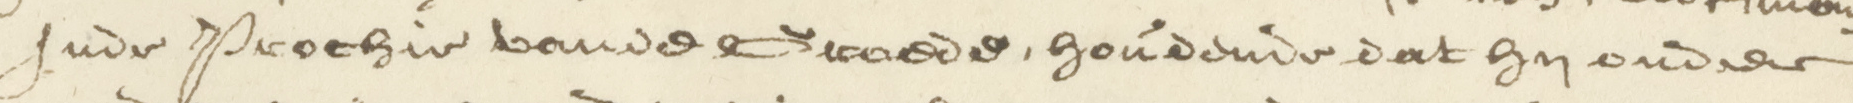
Inde Prochie vande Groede, houdende dat hy onder
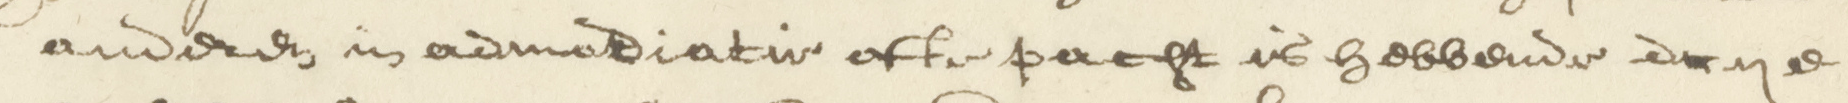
anderen in admodiatie ofte pacht is hebbende drye
